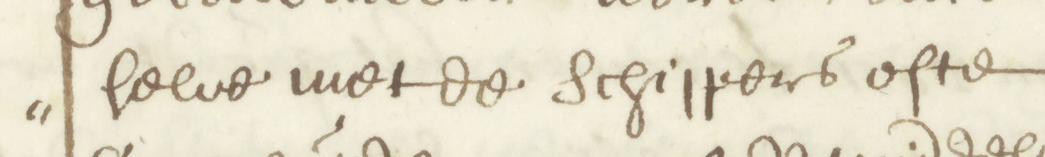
„selve met de Schippers ofte
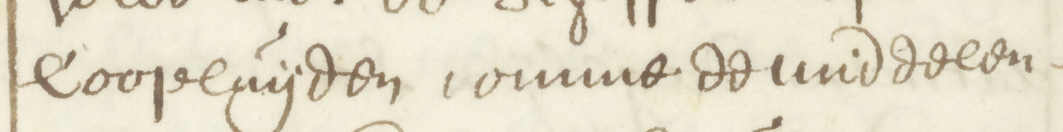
Coopluijden, omme de middelen
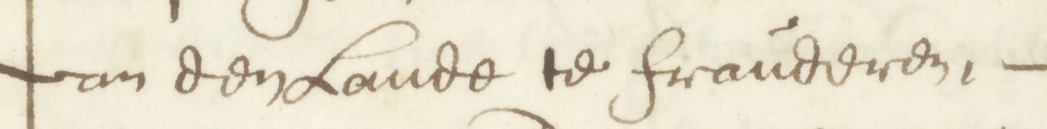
van den Lande te Frauderen,
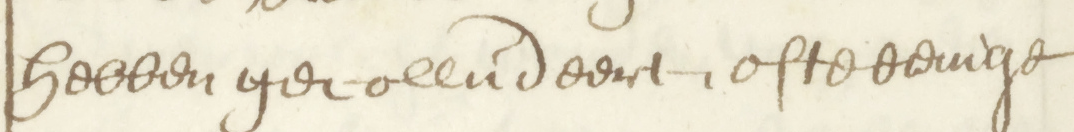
hebben gecolludeert, ofte eenige
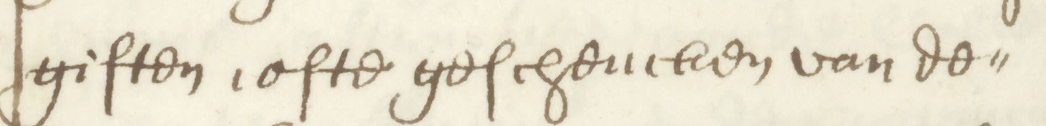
giften, ofte geschencken van de„
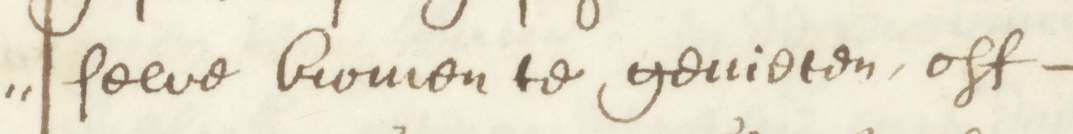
„selve komen te genieten, off —
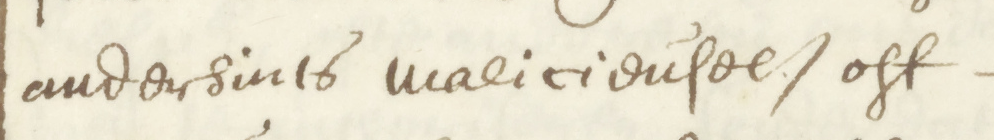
andersints malicieusel off —
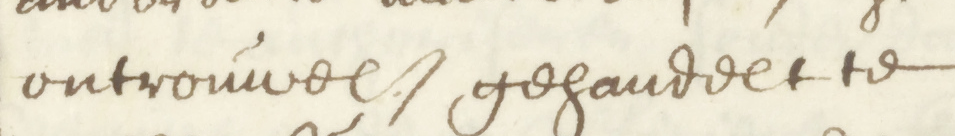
ontrouwel gehandelt te
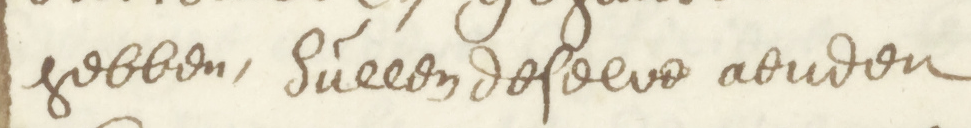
hebben, Sullen deselve aenden
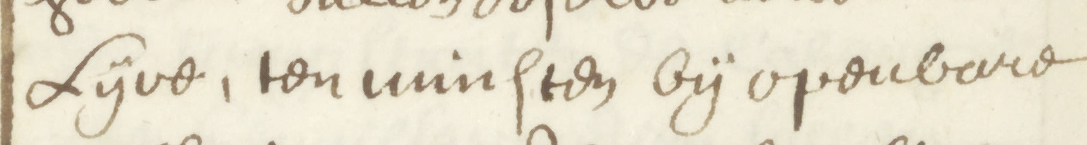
Lijve, ten minsten bij openbare
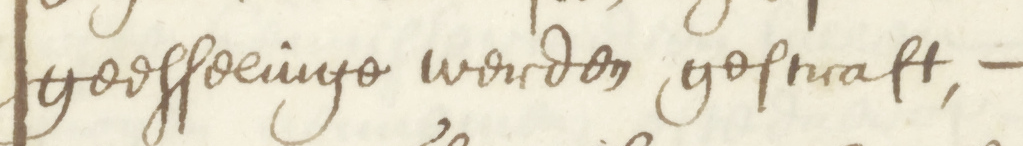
geesselinge werden gestraft,
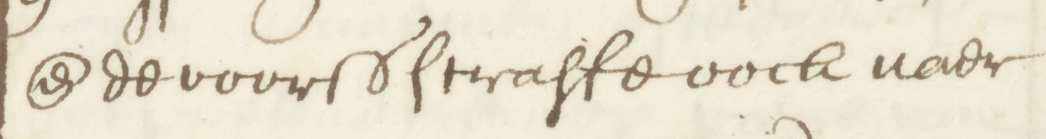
& de voors straffe oock naer
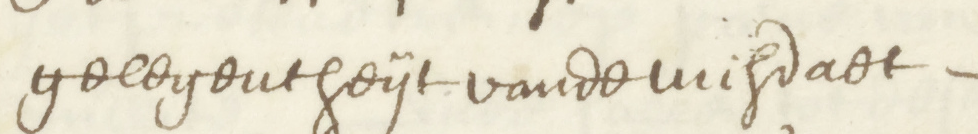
gelegentheijt vande misdaet
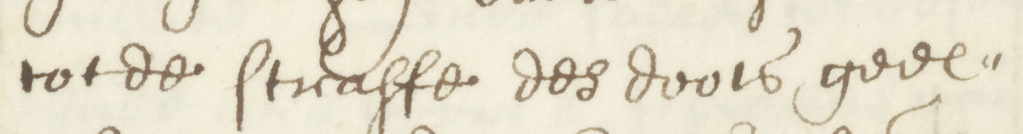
tot de straffe des doots geex„
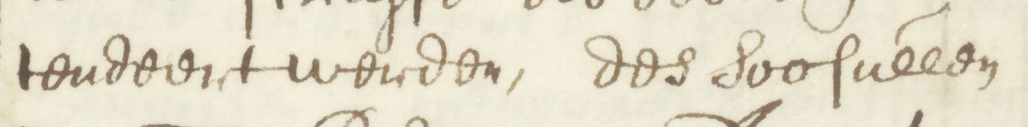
„tendeert werden, des soo sullen
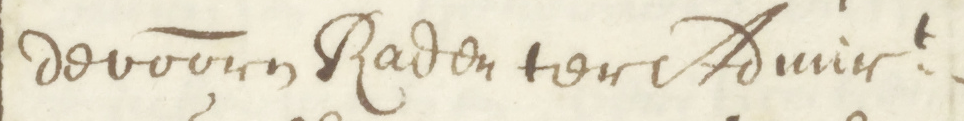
de voorn Raden ter Admirt:
